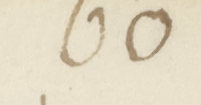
60
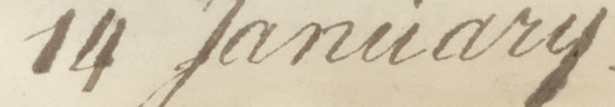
14 Januarij
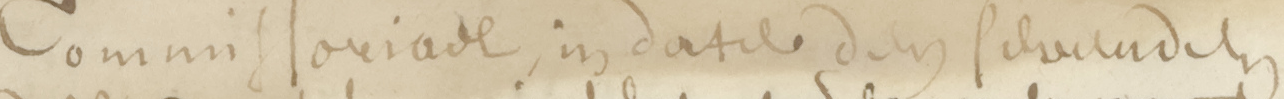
Commissoriael in date den sevenden
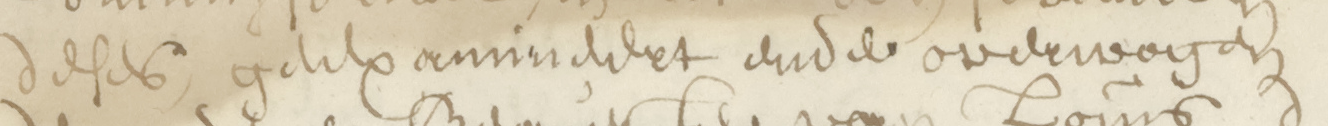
deses, geexamineert ende overwogen
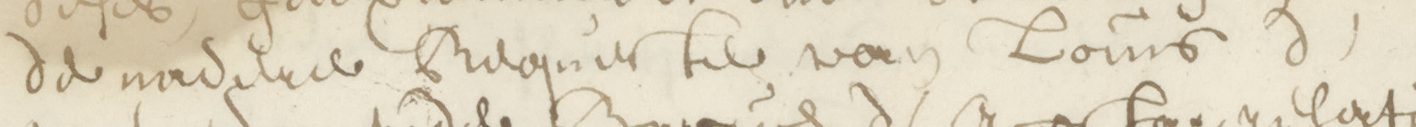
de nadere Requeste van Louis d'
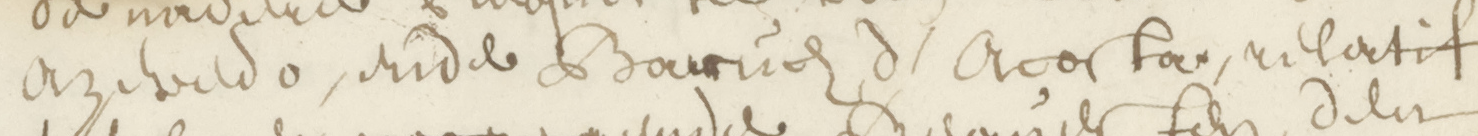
Azevedo, ende Baruch d'Acosta, relatif
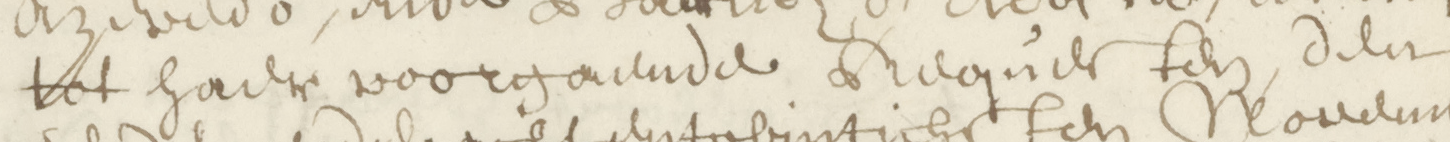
tot haer voorgaende Requesten, den
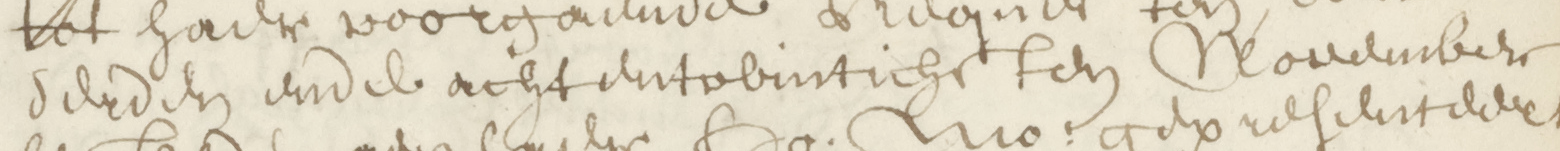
derden ende achtentwintichsten November
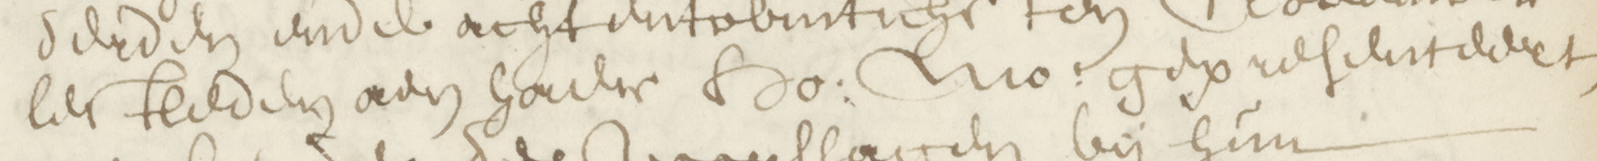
lestleden aen haer Ho:Mo: gepresenteert
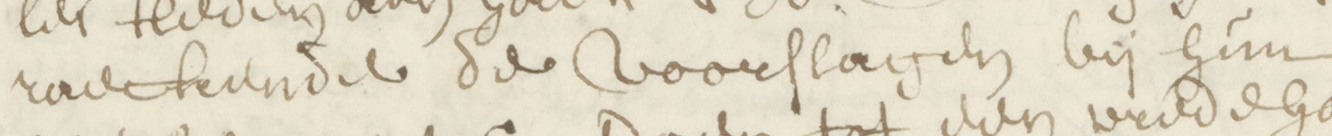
raeckende de voorslagen bij hun
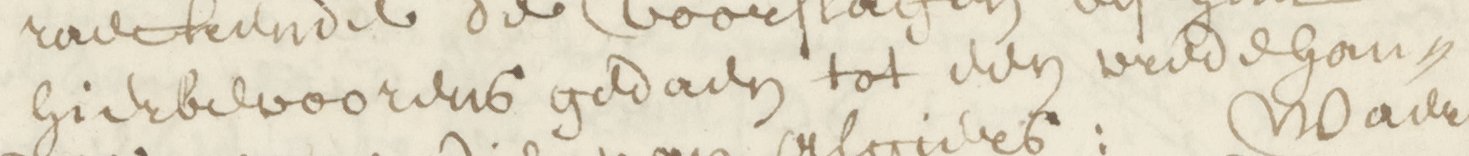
hierbevoorens gedaen tot een vrede han,,
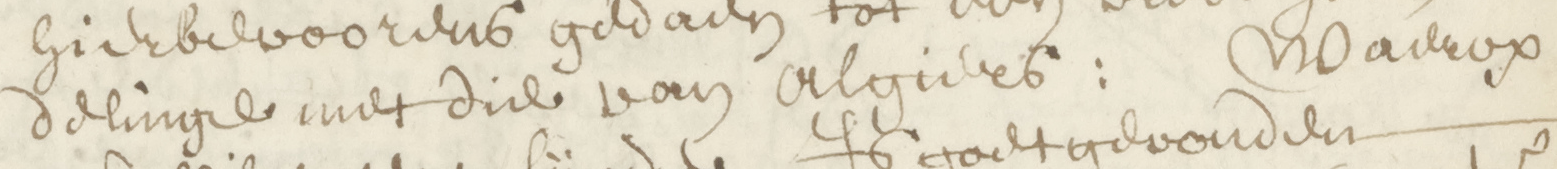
delinge met die van Algiers: Waerop
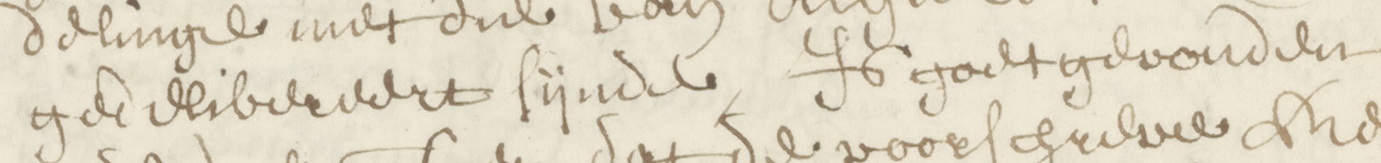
gedelibereert sijnde, is goetgevonden
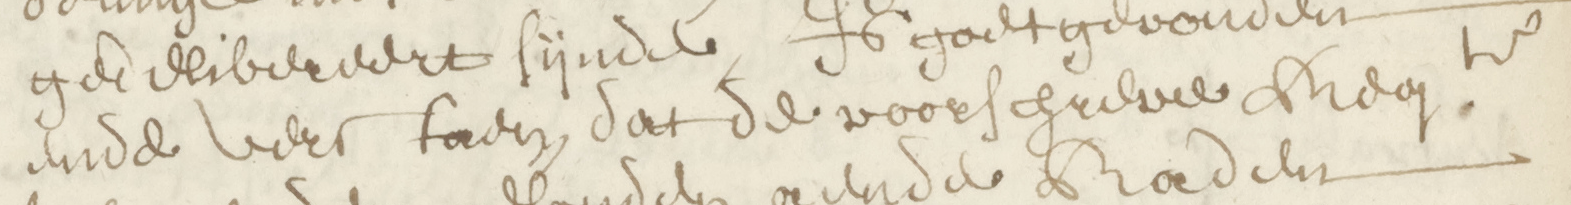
ende verstaen, dat de voorschreve Reqte.
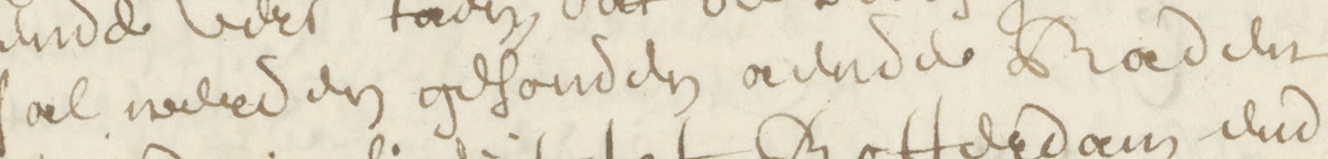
sal werden gesonden aende Raden
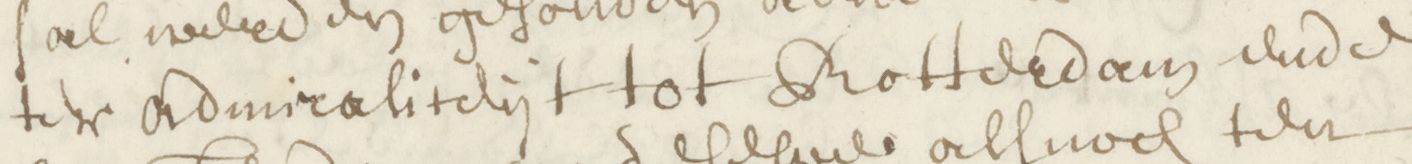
ter Admiraliteijt tot Rotterdam ende
